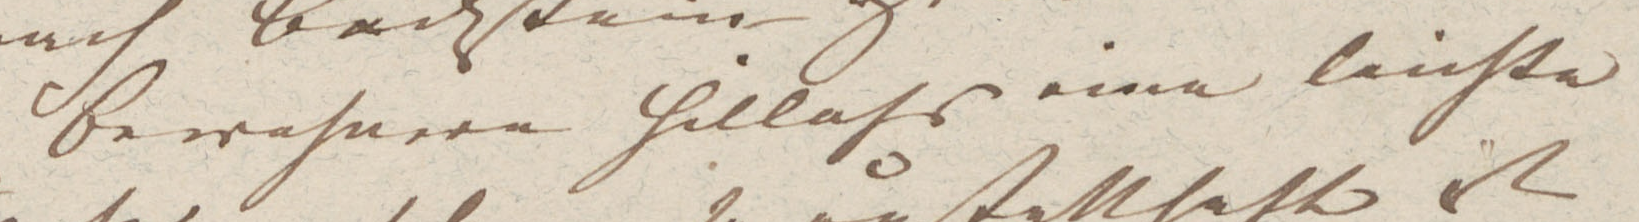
Bewohnern Hillahs eine leichte
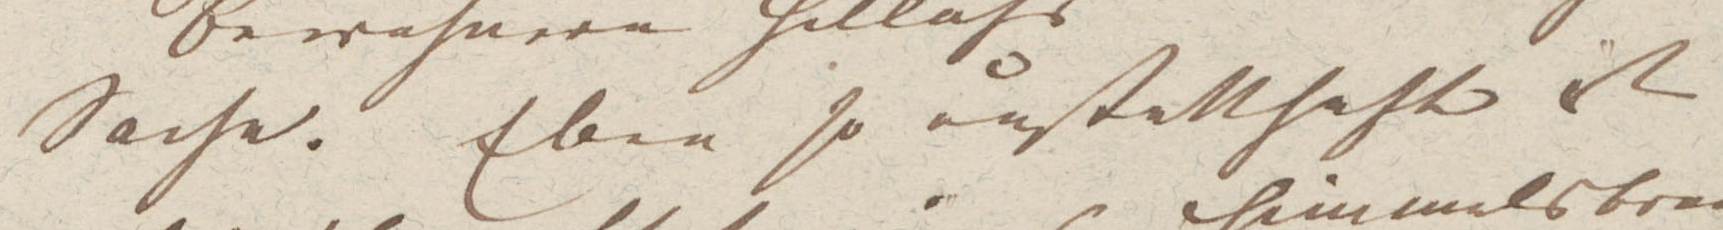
Sache. Eben so unstatthaft ist
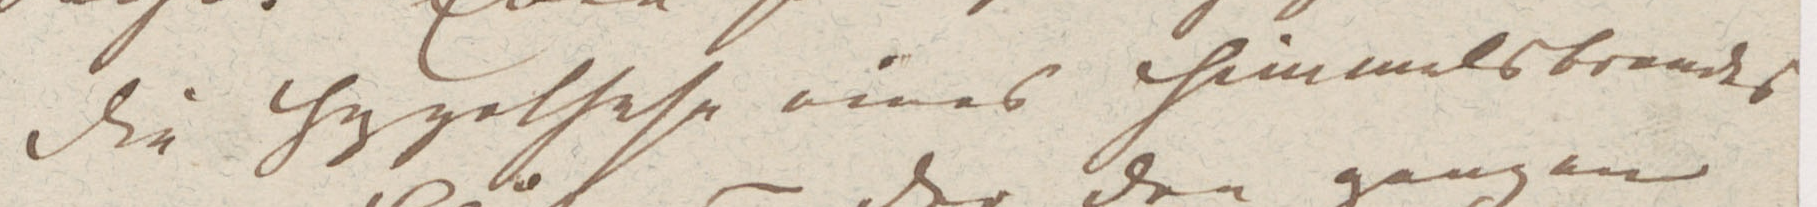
die Hypothese eines Himmelsbrandes
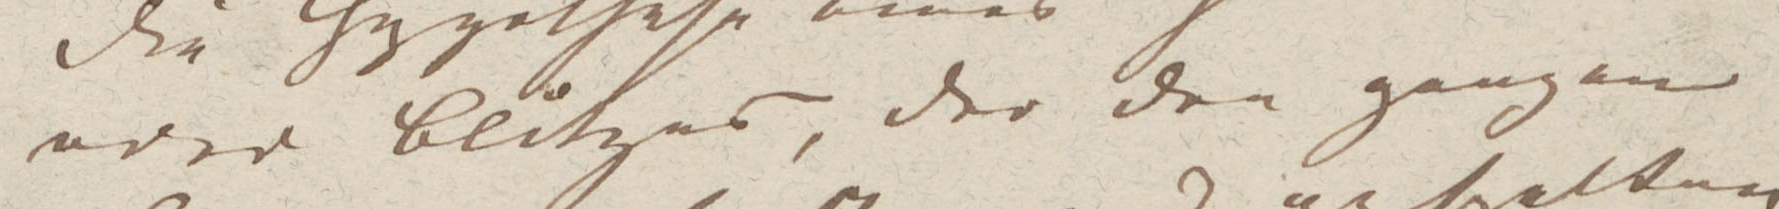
oder Blitzes, der den ganzen
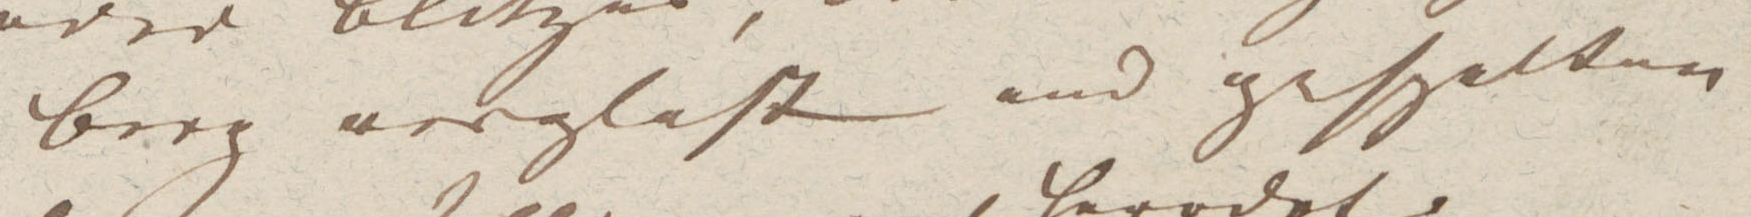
Berg verglast und gespalten
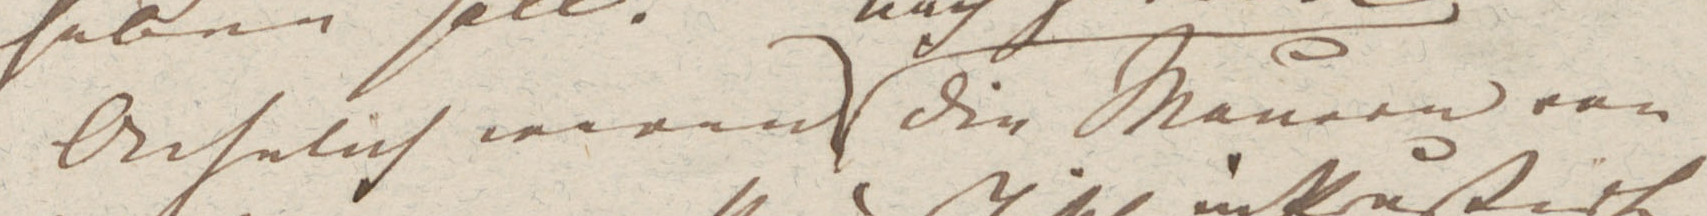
Aehnlich waren nach Herodot die Mauern von
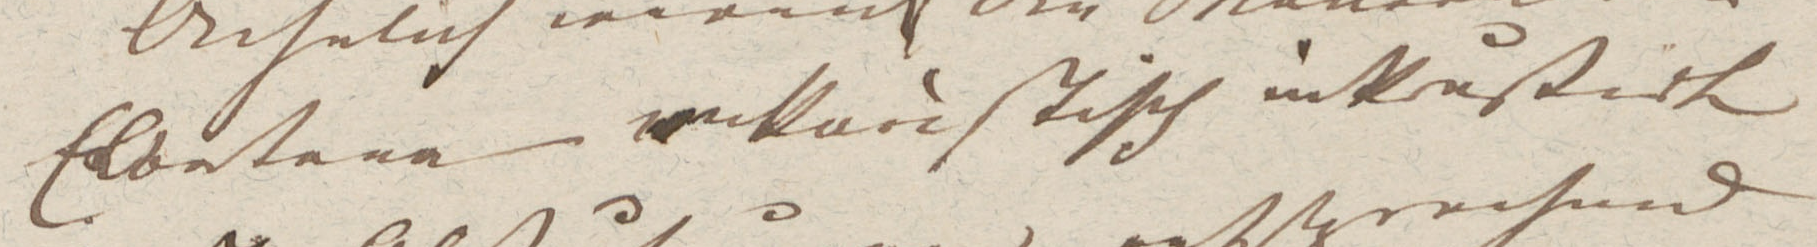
Ekbatana enkaustisch inkrustirt
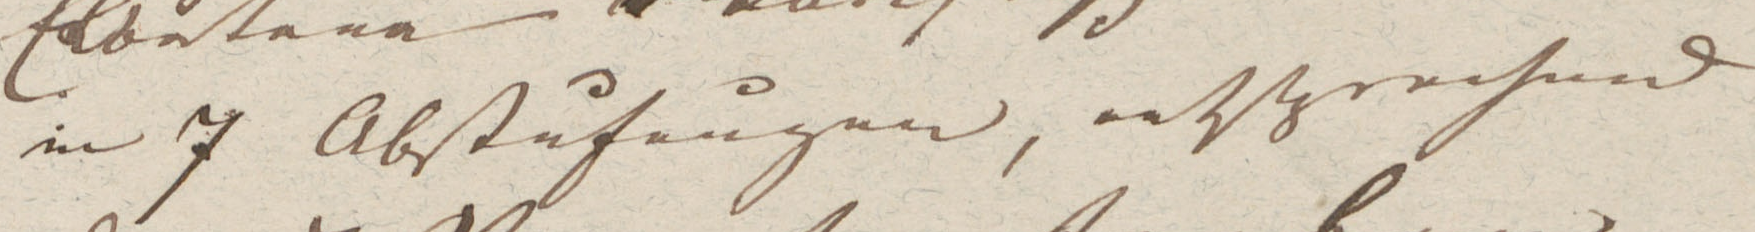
in 7 Abstufungen, entsprechend
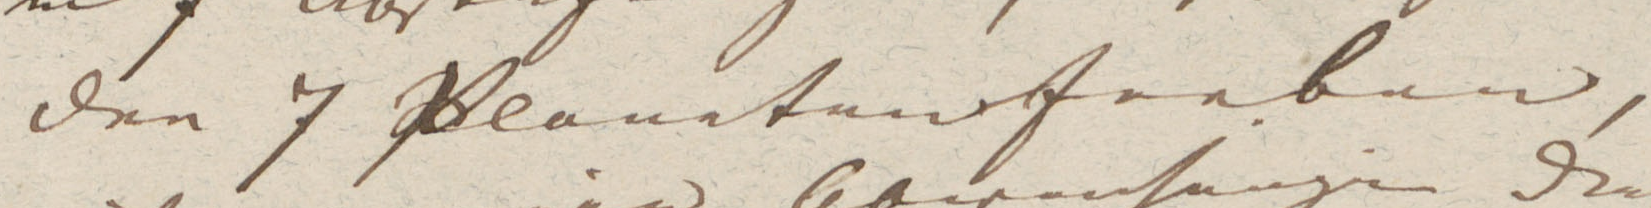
den 7 Planetenfarben,
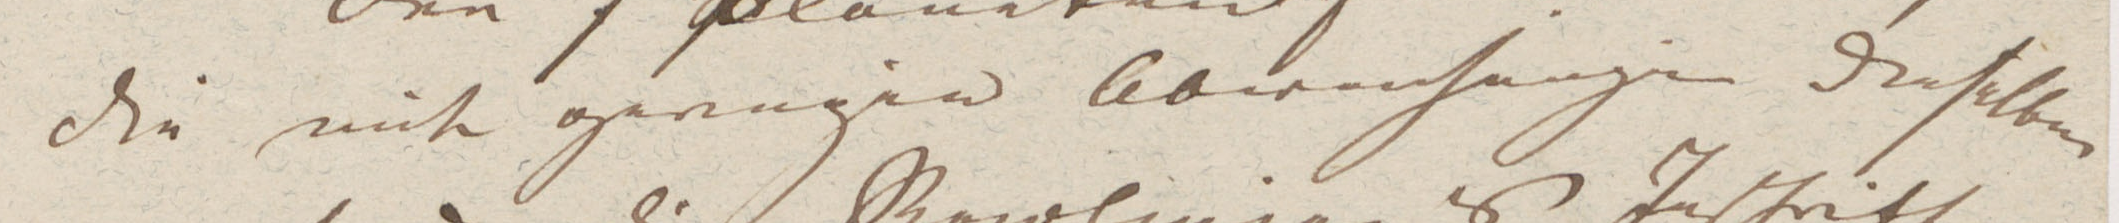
die mit geringen Abweichungen dieselben
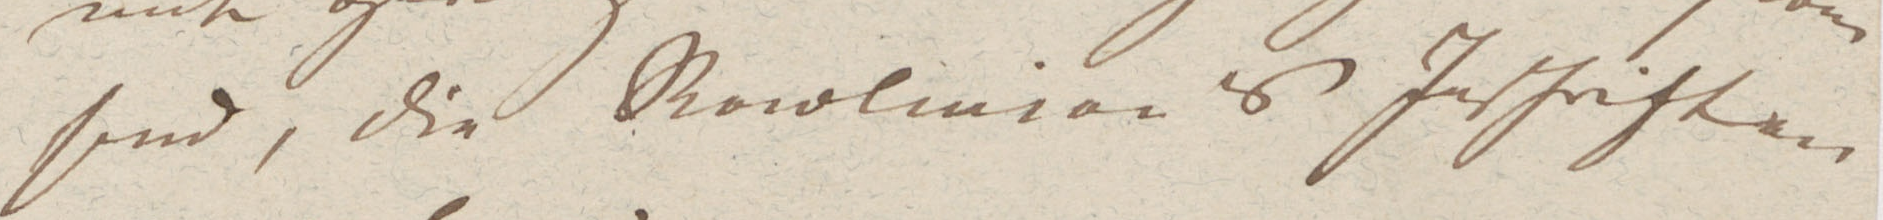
sind, die Rawlinsons Inschriften
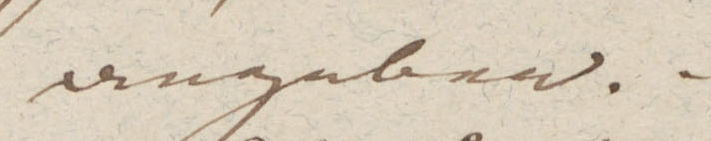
angeben. –
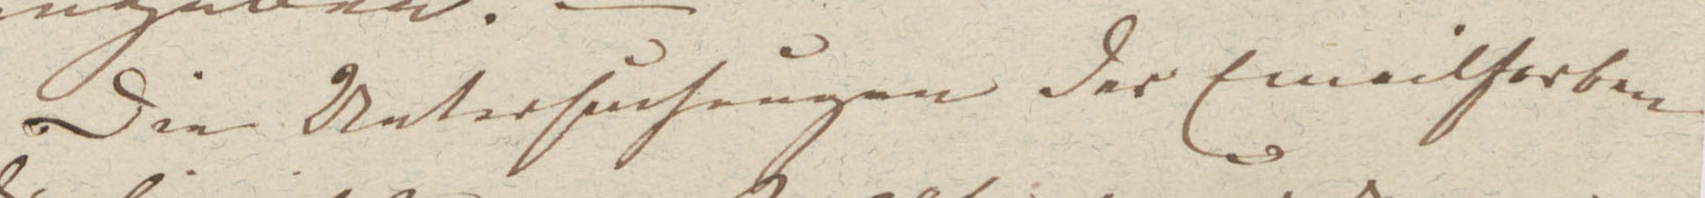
Die Untersuchungen der Emailfarben
